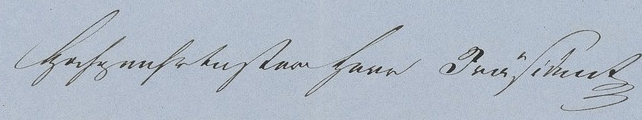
Hochgeehrtester Herr Präsident
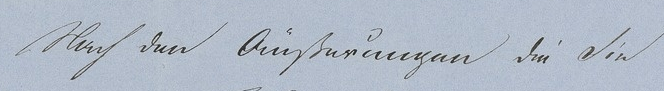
Nach den Äußerungen die Sie
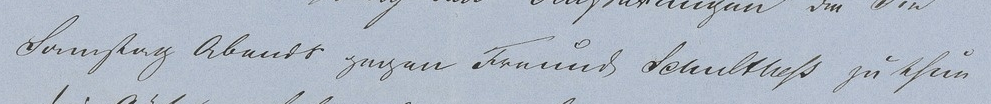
Samstag Abends gegen Freund Schulthess zu thun
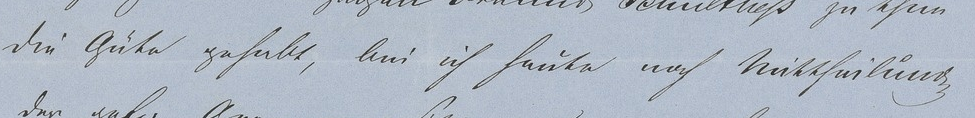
die Güte gehabt, bin ich heute nach Mittheilung
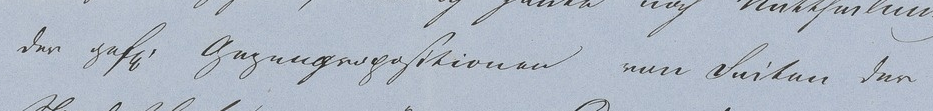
der gefg. Gegenpropositionen von Seiten der
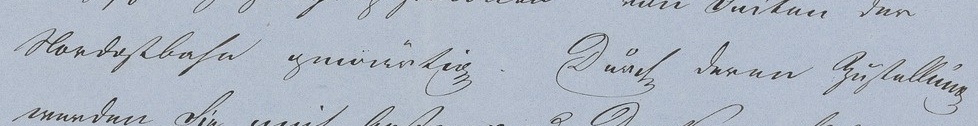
Nordostbahn gewärtig. Durch deren Zustellung
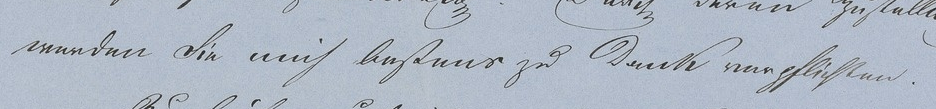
werden Sie mich bestens zu Dank verpflichten.
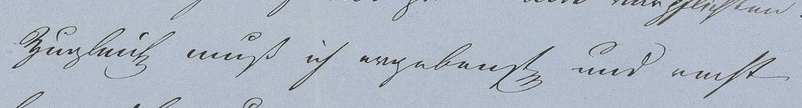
Zugleich muß ich ergebenst und recht
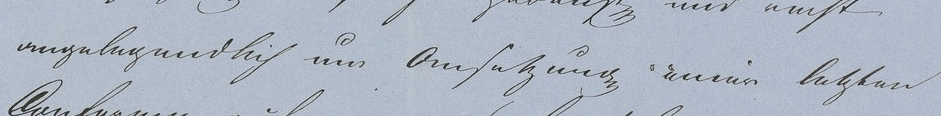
angelegendlich um Ansetzung einer letzten
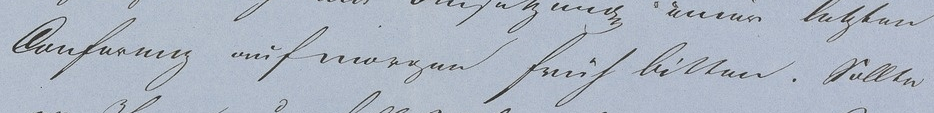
Conferenz auf morgen früh bitten. Sollte
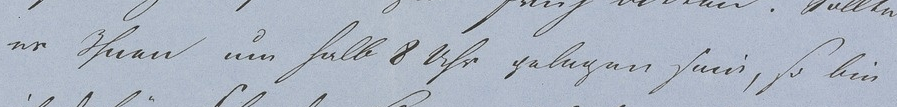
es Ihnen um halb 8 Uhr gelegen sein, so bin
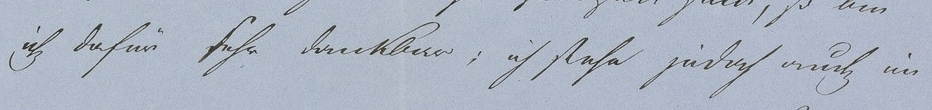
ich dafür sehr dankbar; ich stehe jedoch auch im
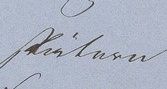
spätern
